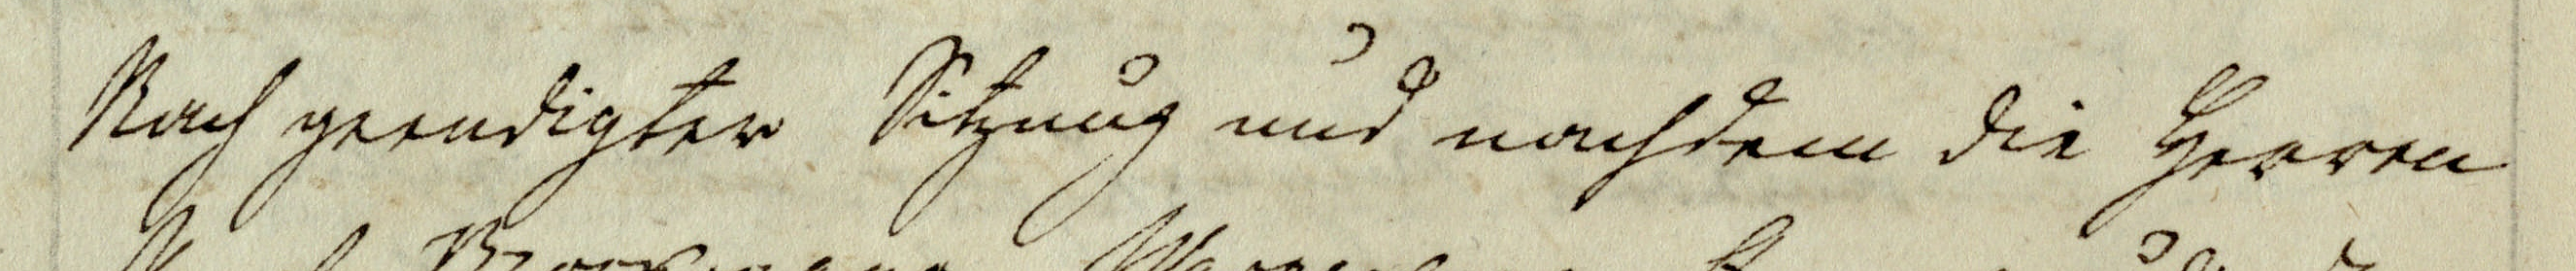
Nach geendigter Sitzung und nachdem die Herren
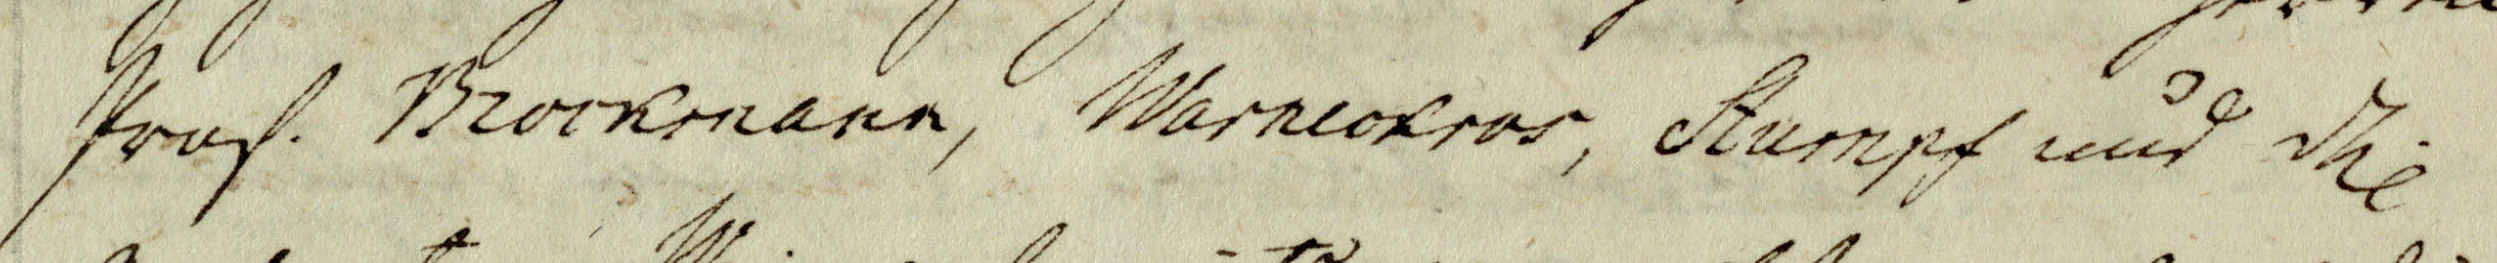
Prof. Brockmann, Warneckros, Stumpf und dh.
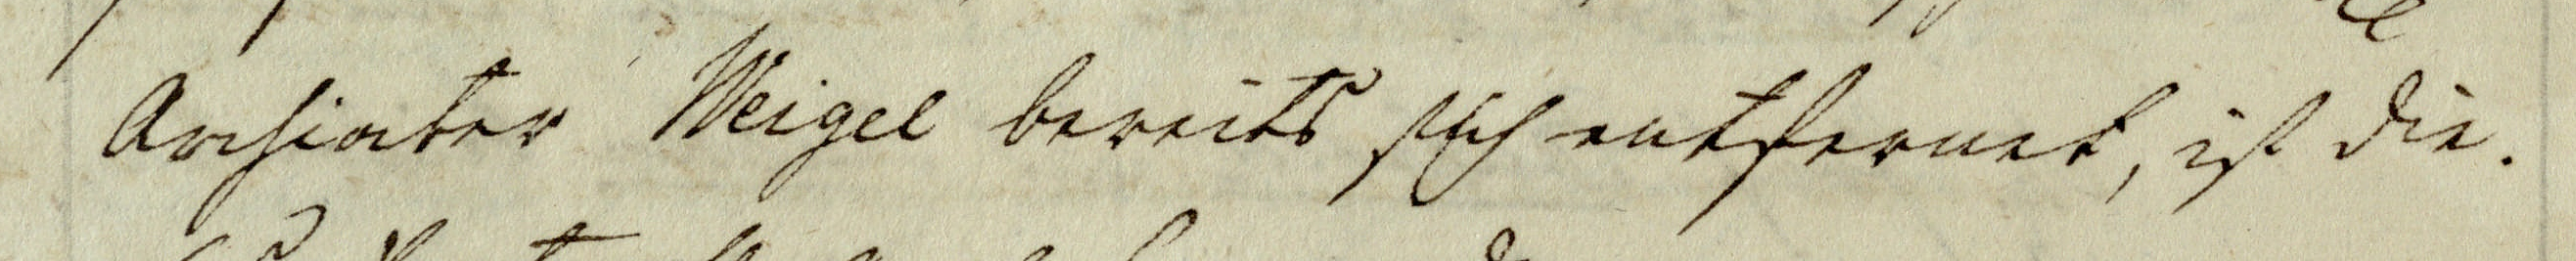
Archiater Weigel bereits sich entfernet, ist die¬
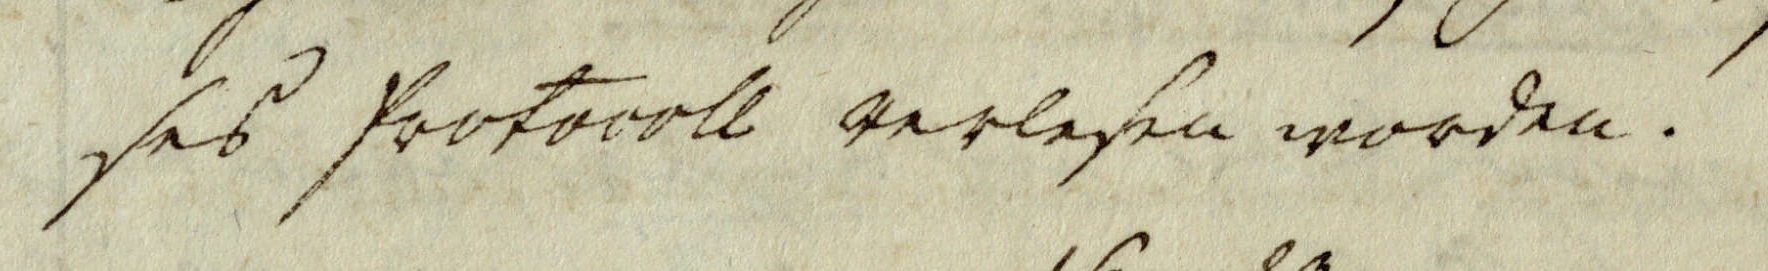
ses Protocoll verlesen worden.
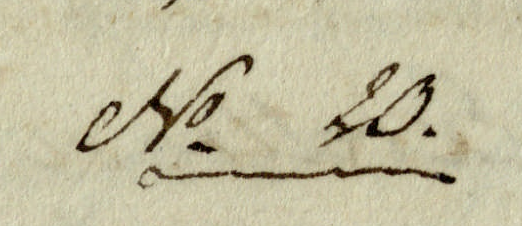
No 20.
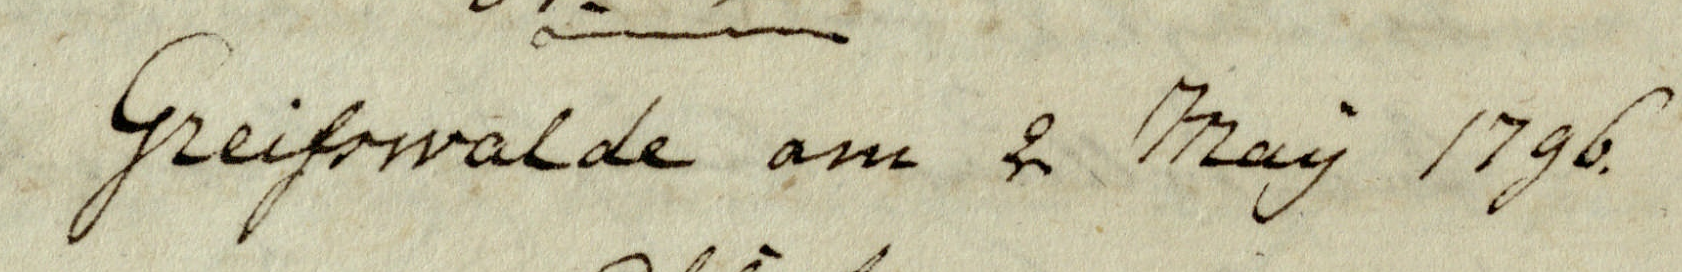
Greifswalde am 2. Maÿ 1796.
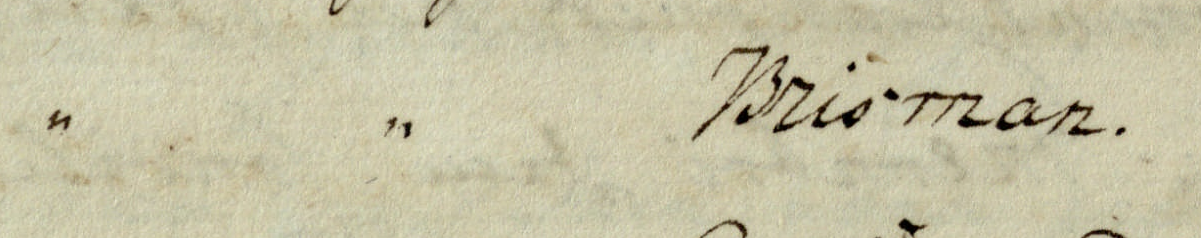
Brisman.
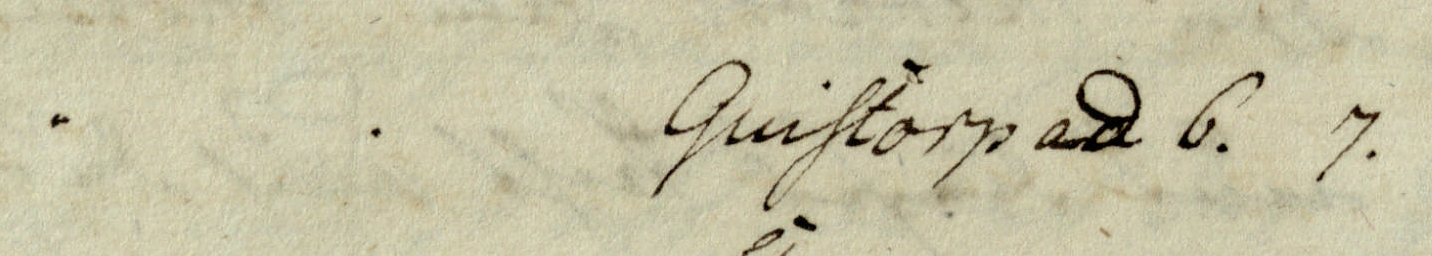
Quistorp ad 6. 7.
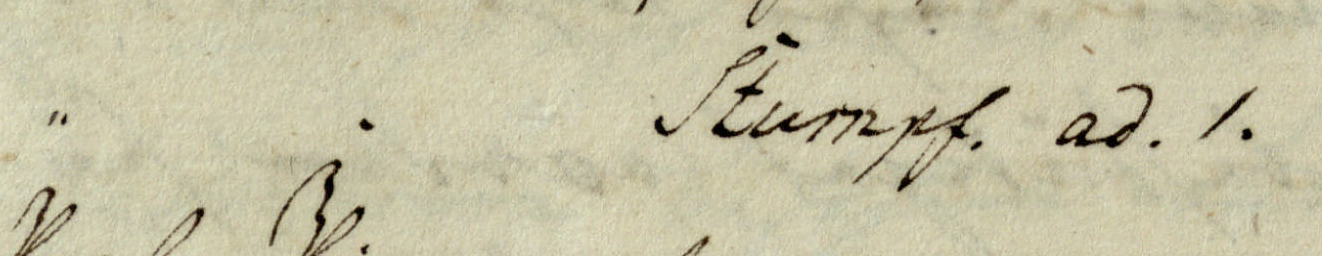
Stumpf. ad. 1.
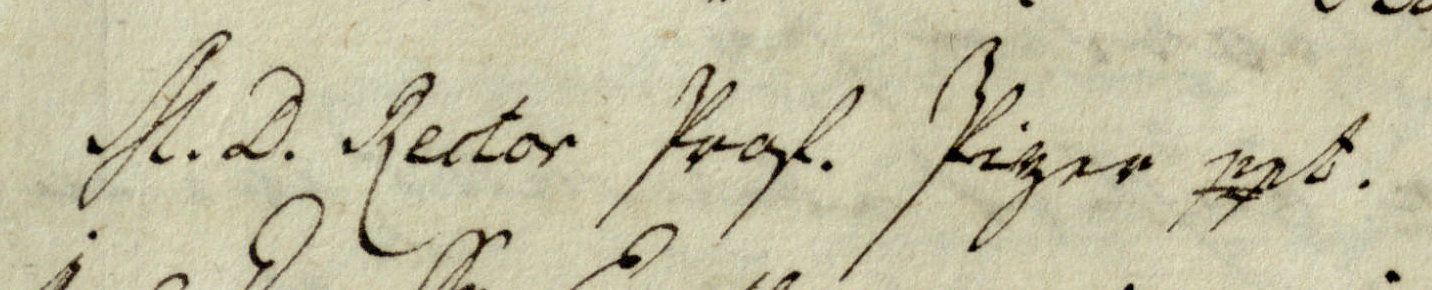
M. D. Rector Prof. Piper ppt.
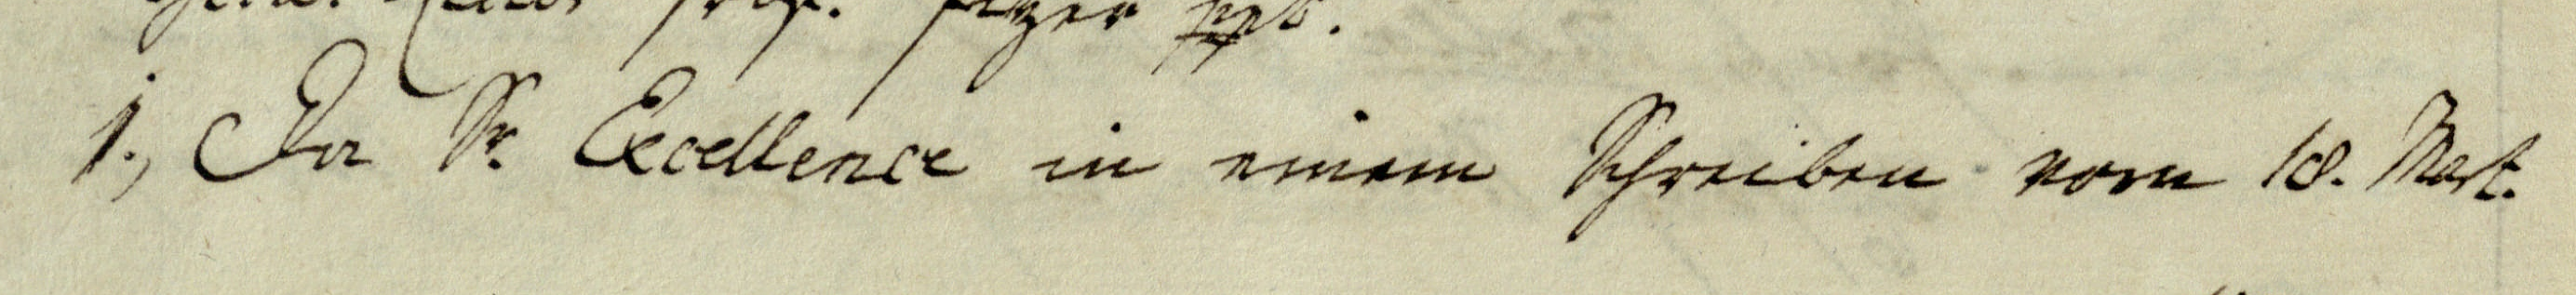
1., Da Sr Excellence in einem Schreiben vom 18. Mart.
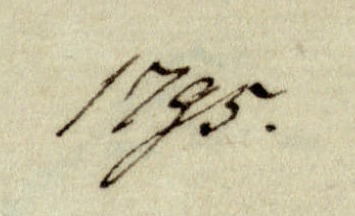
1795.
